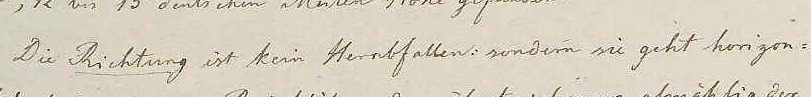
Die Richtung ist kein Herabfallen: sondern sie geht horizon-
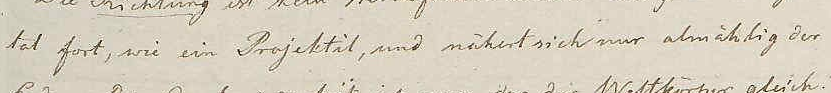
tal fort, wie ein Projektil, und nähert sich nur almählig der
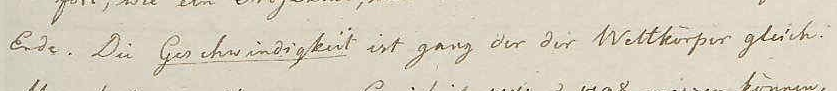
Erde. Die Geschwindigkeit ist ganz der der Weltkörper gleich.
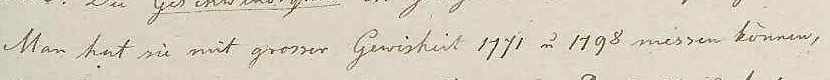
Man hat sie mit grosser Gewisheit 1771 u 1798 messen können,
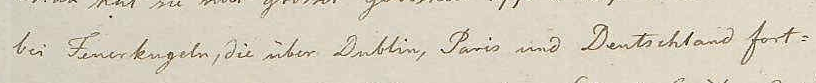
bei Feuerkugeln, die über Dublin, Paris und Deutschland fort-
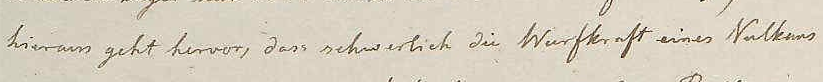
hieraus geht hervor, dass schwerlich die Wurfkraft eines Vulkans
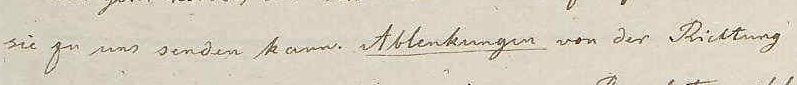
sie zu uns senden kann. Ablenkungen von der Richtung
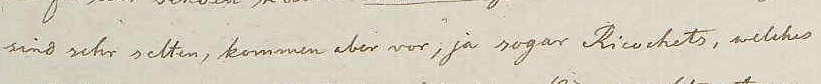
sind sehr selten, kommen aber vor, ja sogar Ricochets, welches
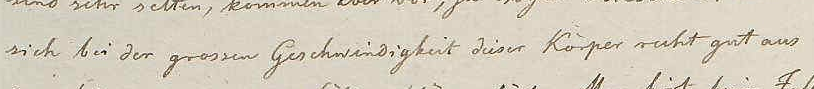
sich bei der grossen Geschwindigkeit dieser Körper recht gut aus
